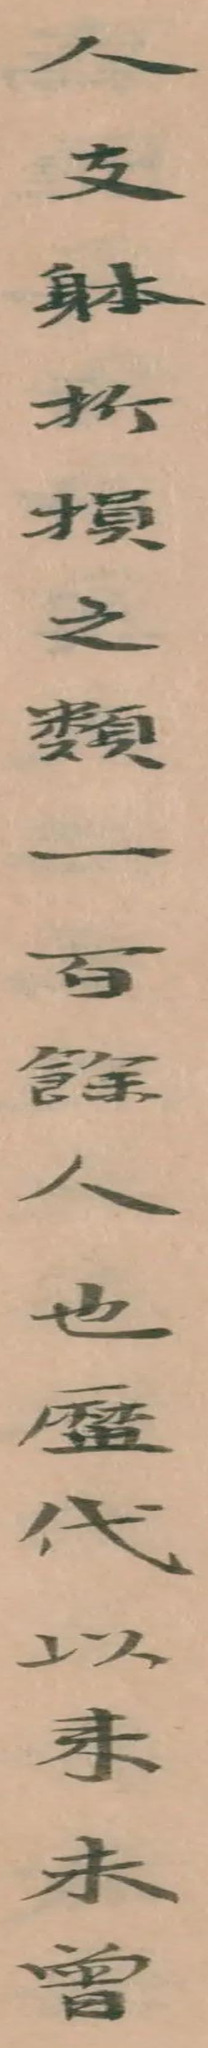人支体折損之類一百余人也歴代以来未曽
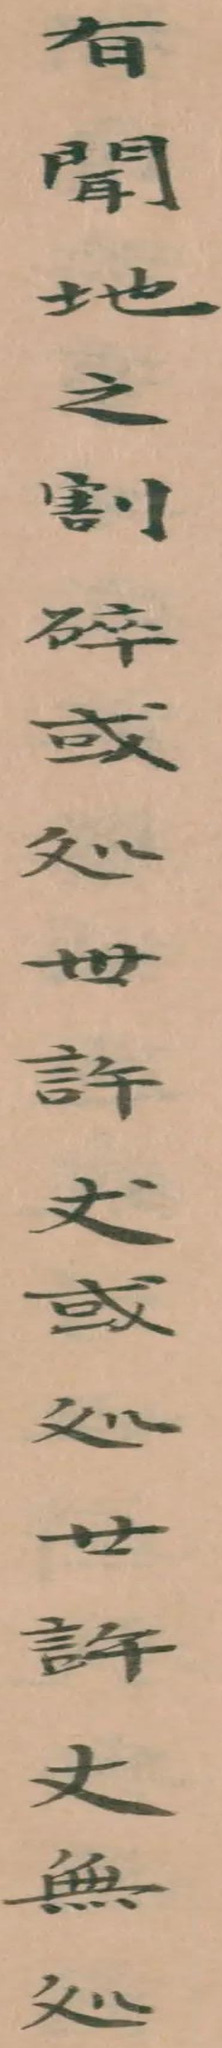有聞地之割砕或処卅許丈或処廿許丈無処
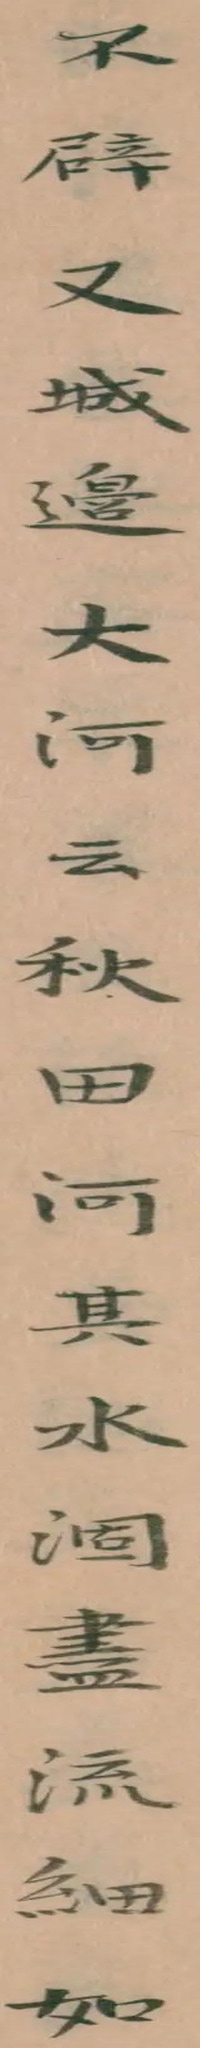不辟又城辺大河云秋田河其水涸尽流細如
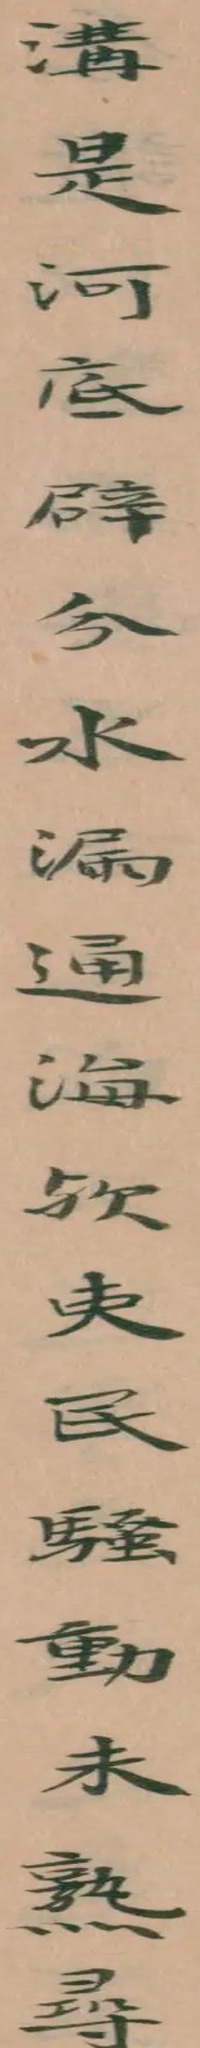溝是河底辟分水漏通海歟吏民騒動未熟尋
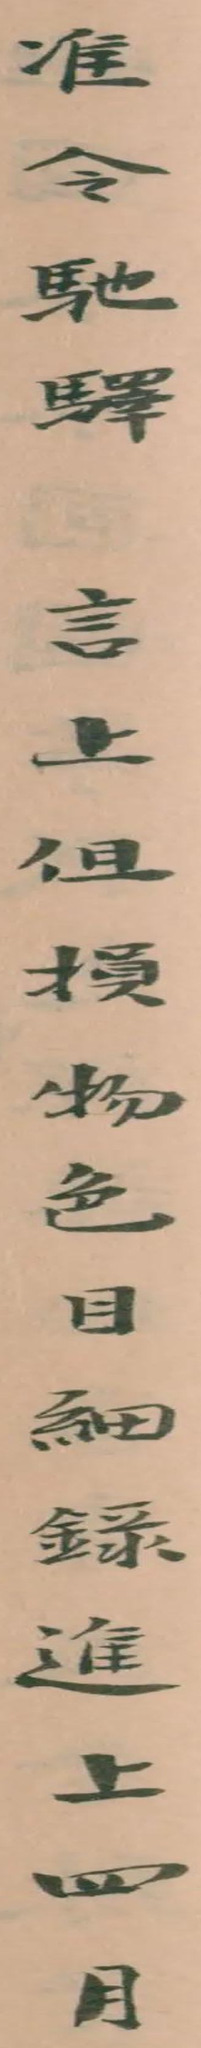准令馳駅言上但損物色目細録進上四月
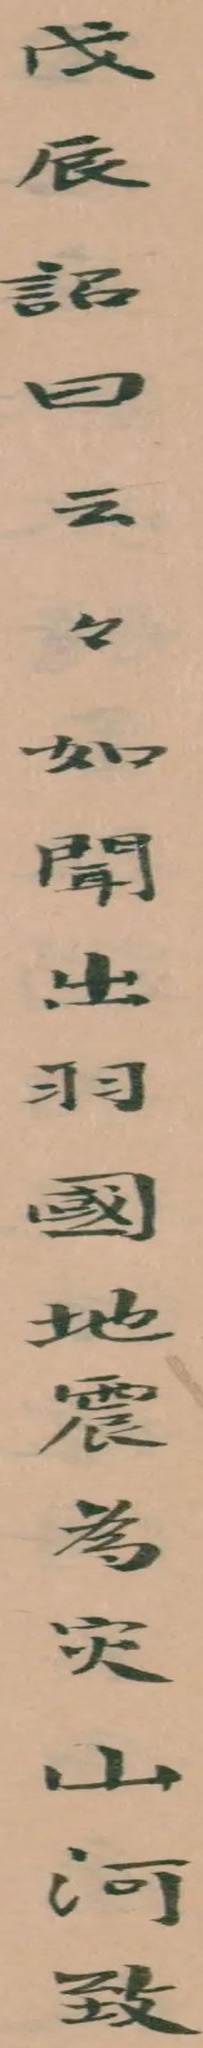戊辰詔曰云々如聞出羽国地震為災山河致
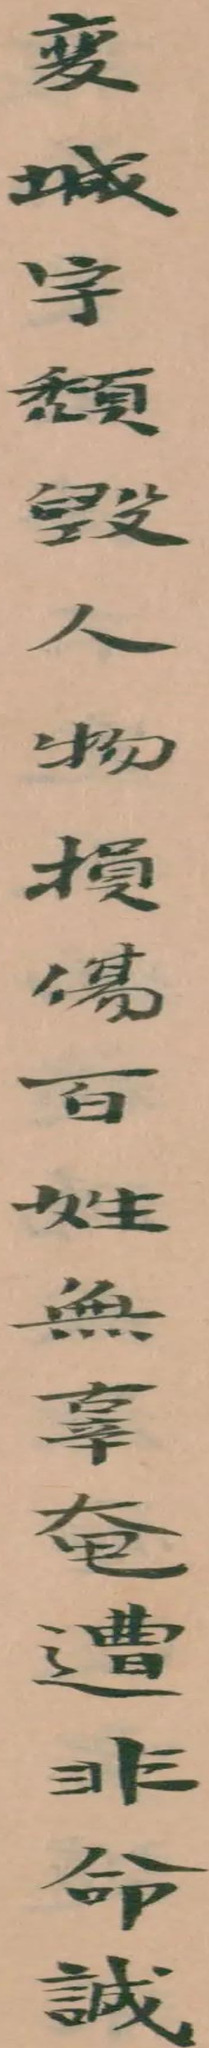変城宇頽毀人物損傷百姓無辜奄遭非命誠
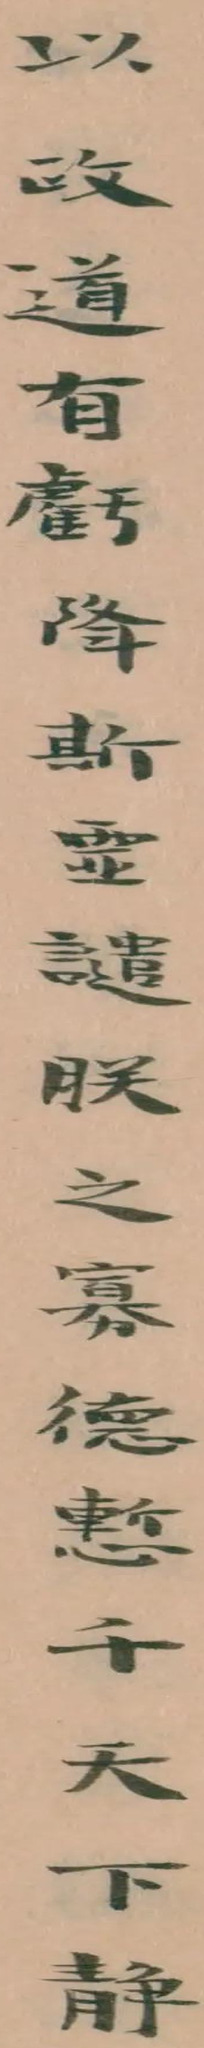以政道有虧降斯霊譴朕之寡徳慙千天下静
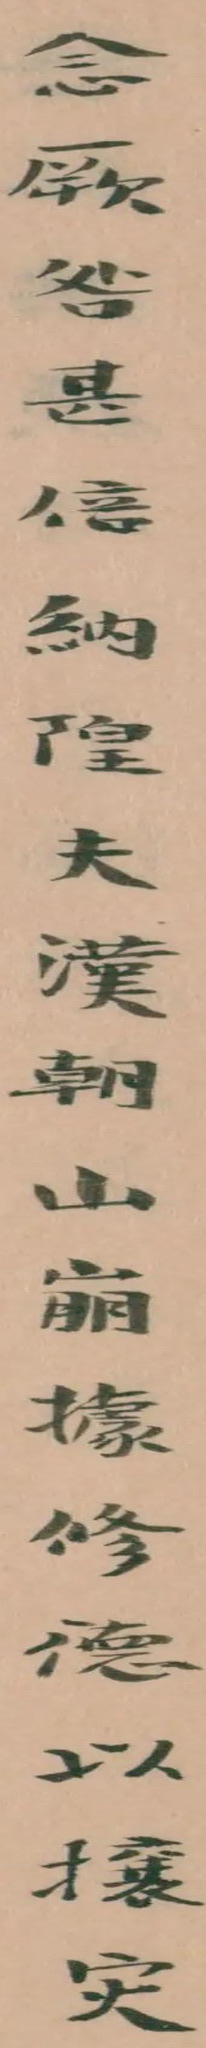念厥咎甚倍納隉夫漢朝山崩拠修徳以攘災
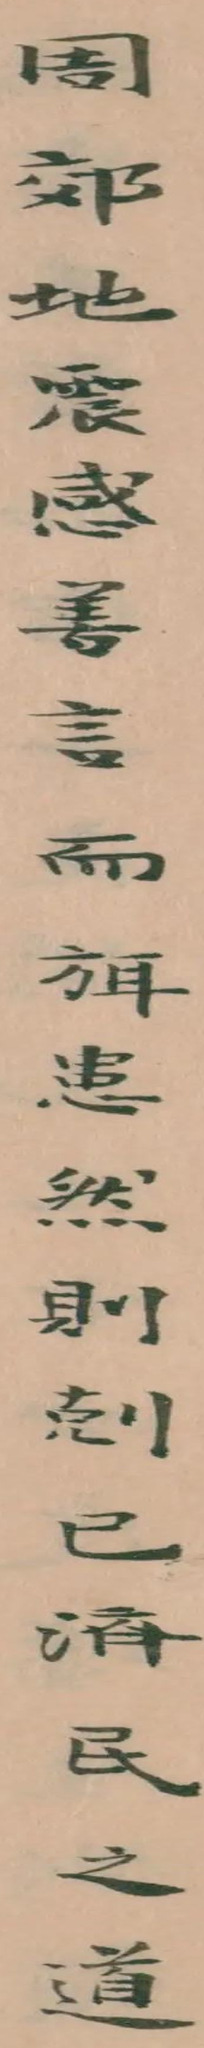周郊地震感善言而患然則剋己済民之道
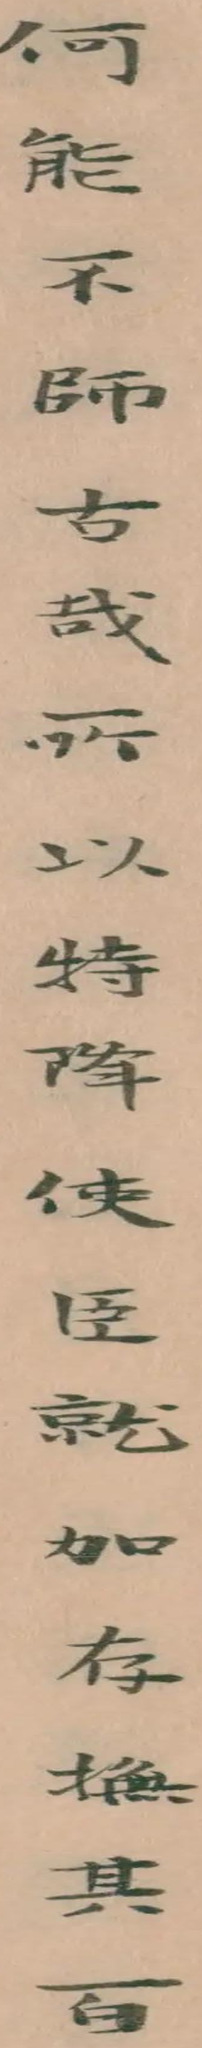何能不帥古哉所以特降使臣就加存撫其百
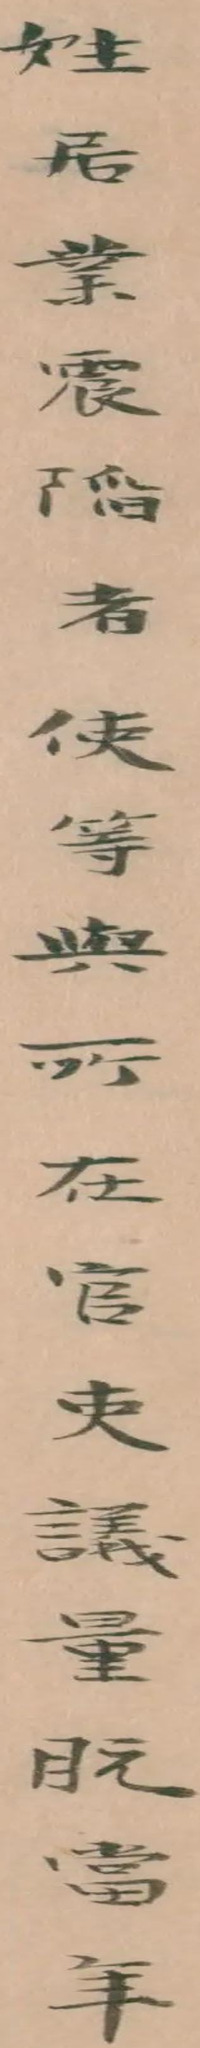姓居業震陥者使等與所在官吏議量盶当年
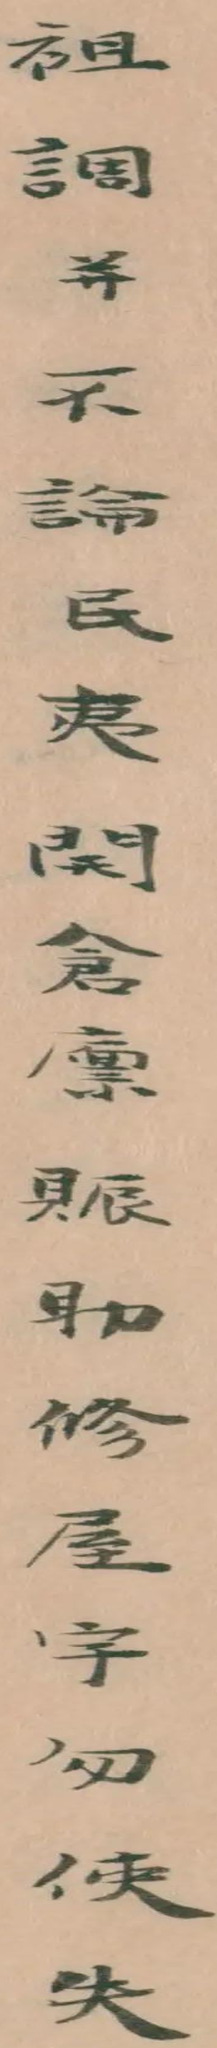租調幷不論民夷開倉廩賑助修屋宇勿使失
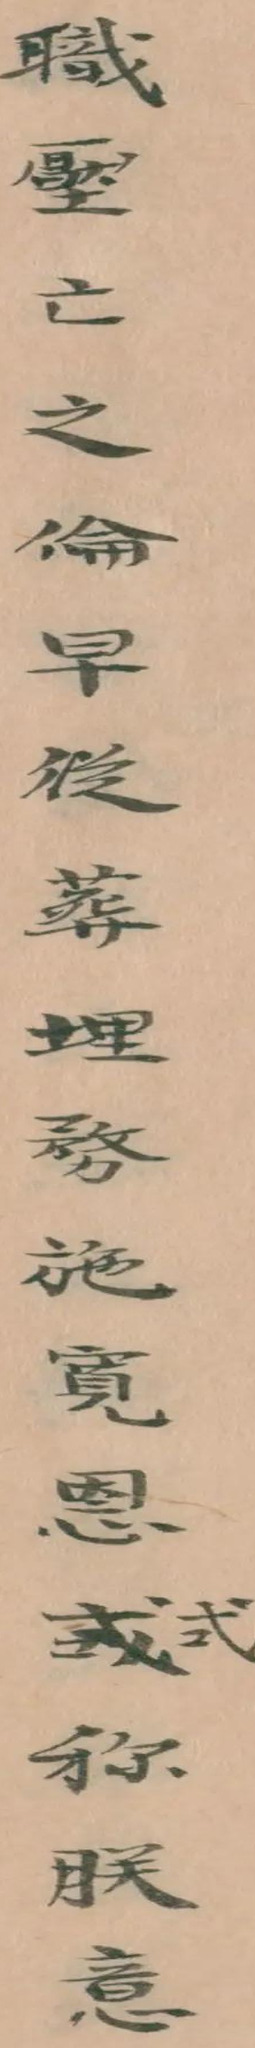職圧亡之倫早従葬埋務施寛恩式称朕意

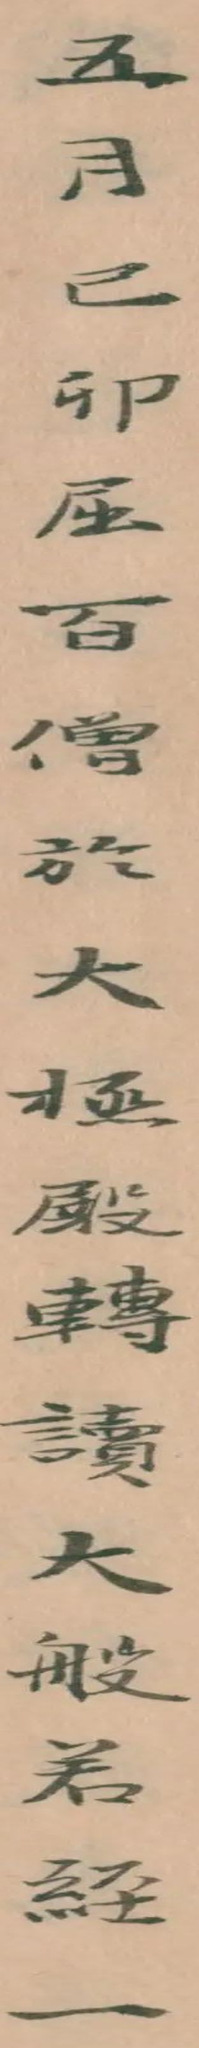五月己卯百屈僧於大極殿転読大般若経一
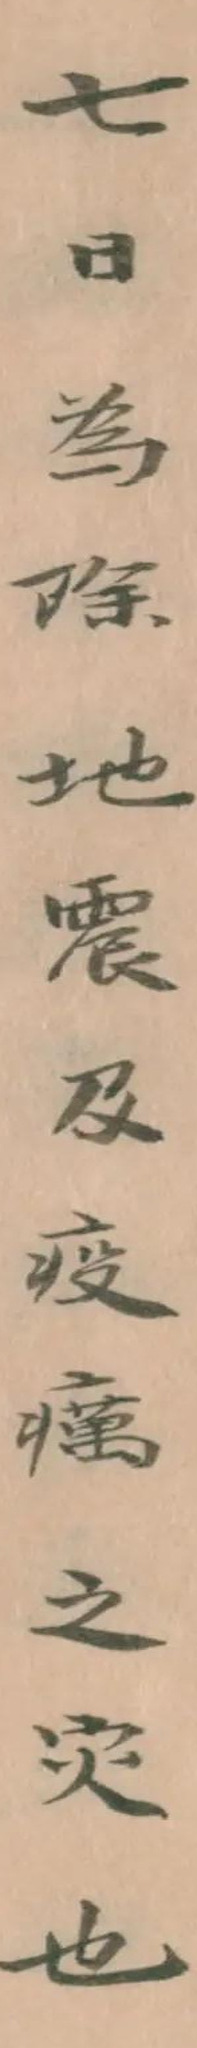七日為除地震及疫病癘之災也
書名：地災撮要. 巻5-6(地震之部)
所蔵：国立国会図書館 National Diet Library, JAPAN
